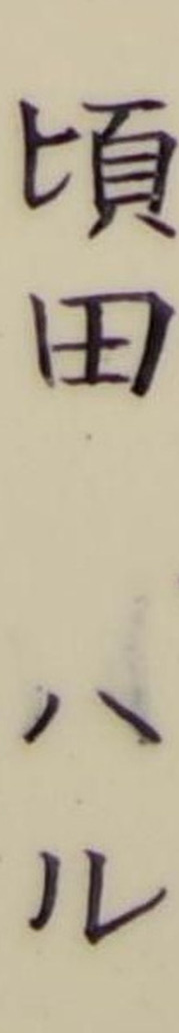須田ハル
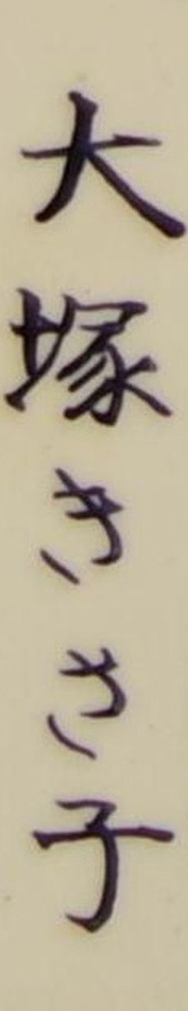大塚きさ子
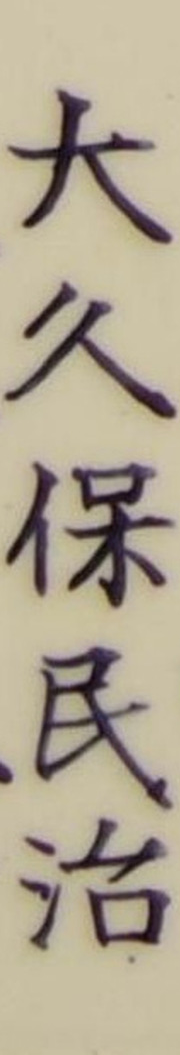大久保民治
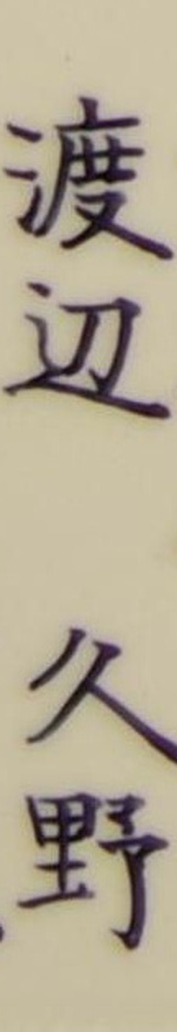渡辺久野

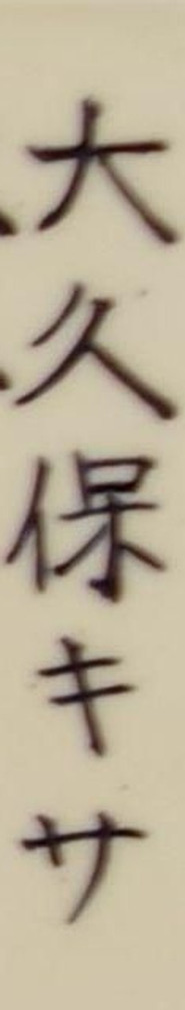大久保キサ
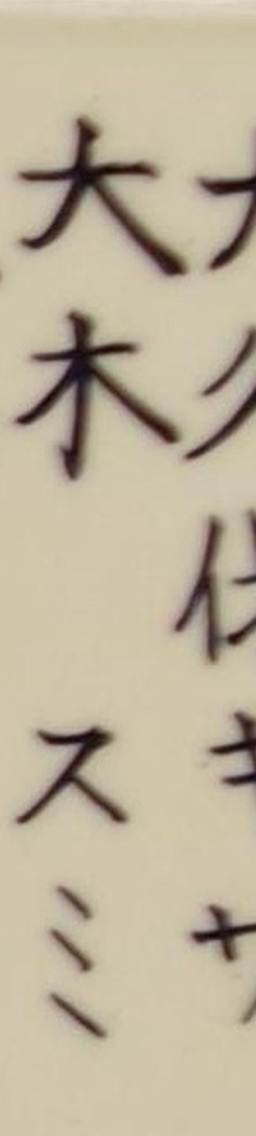大木スミ
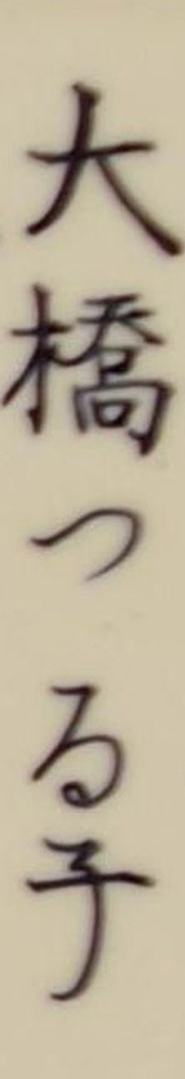大橋つる子
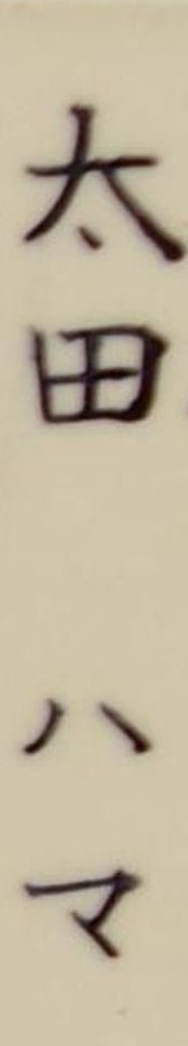太田ハマ
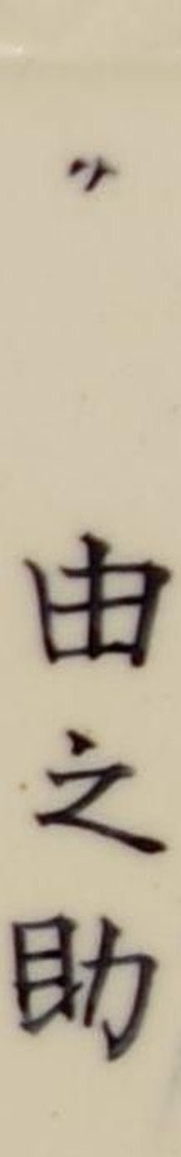由之助
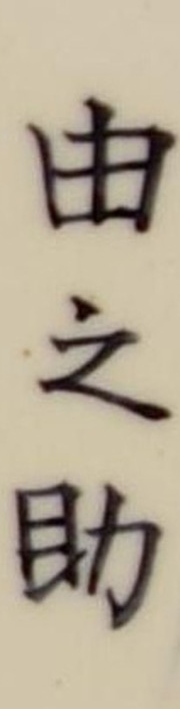由之助
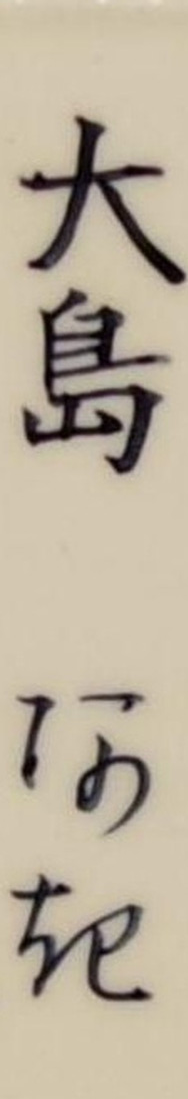大島あき
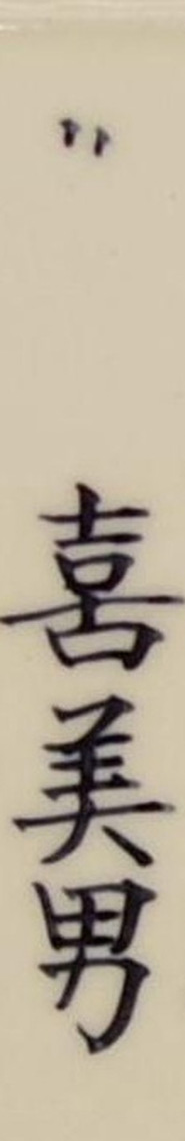喜美男
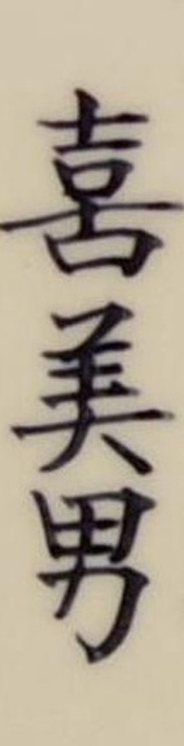喜美男
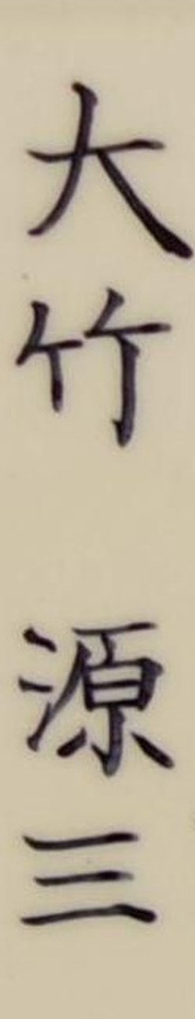大竹源三
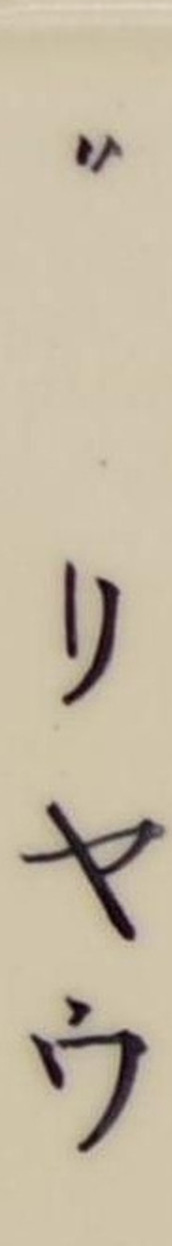リヤウ
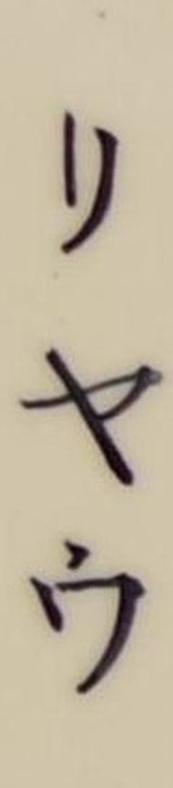リヤウ
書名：E~L
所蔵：高野山金剛峯寺
